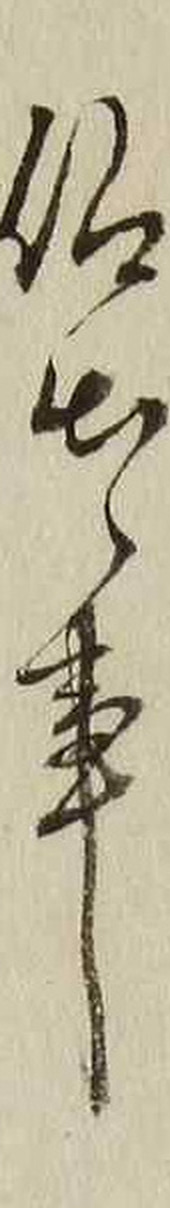仰出候事
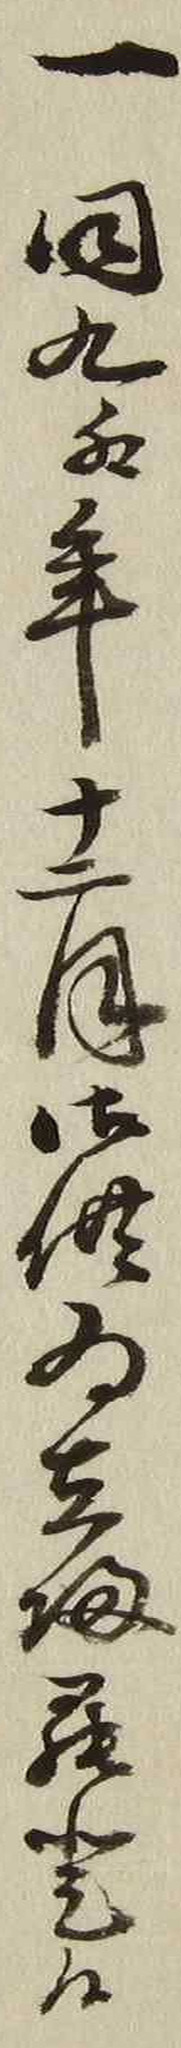一同九卯年十二月御供為立帰罷登候
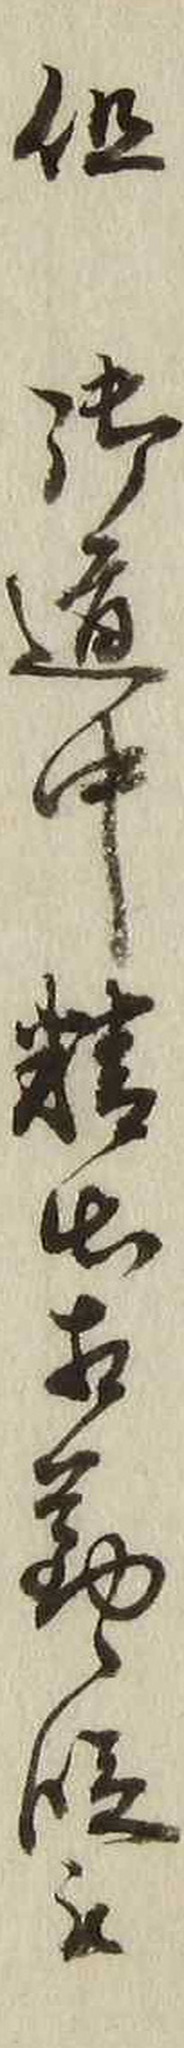但御道中精出相勤段候被
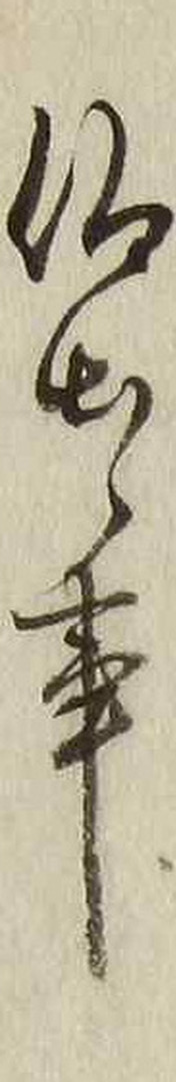仰出候事
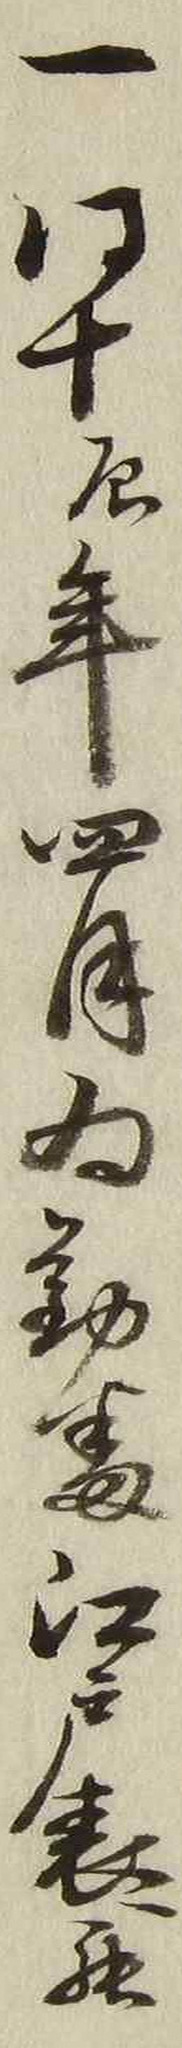一同十辰年四月為勤番江戸表へ罷
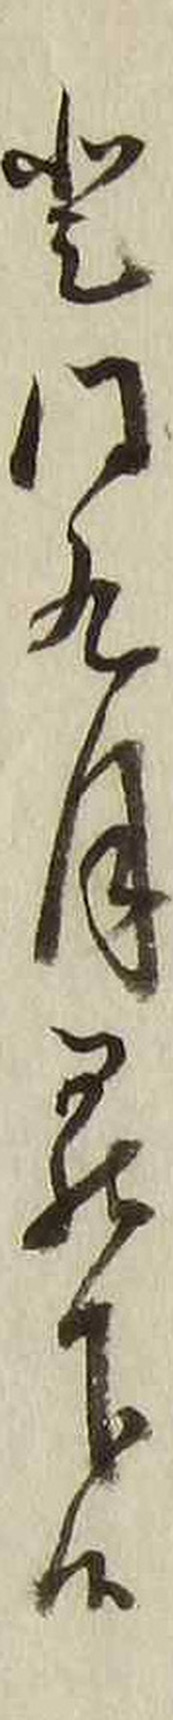登同九月罷下候
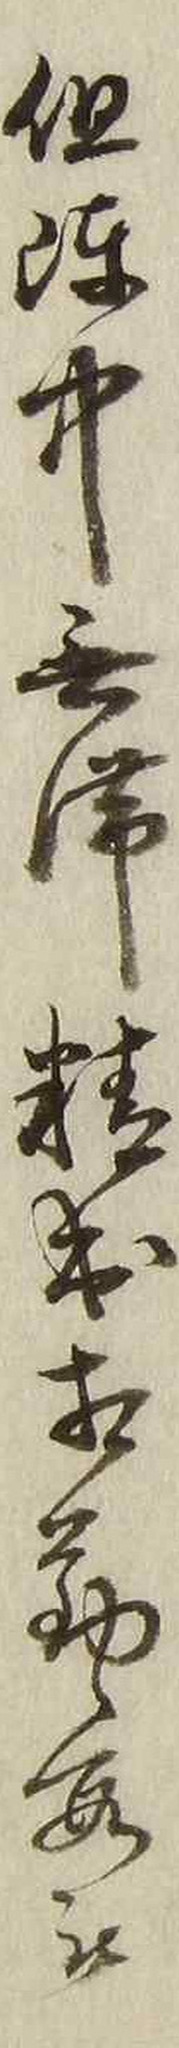但陣中無滞精出相勤候段被
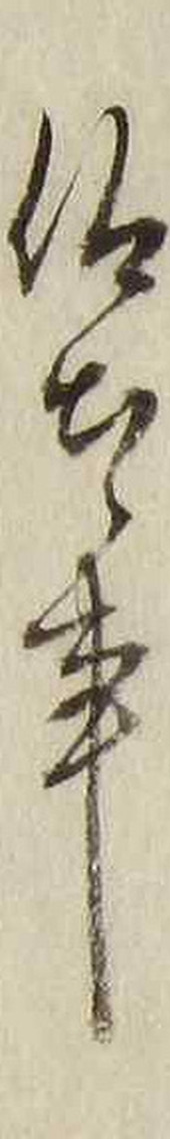仰出候事
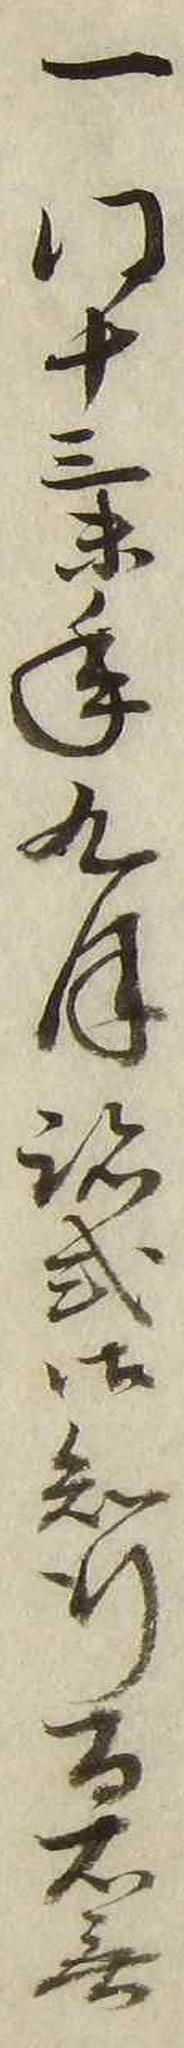一同十三未年九月跡式御知行百右無

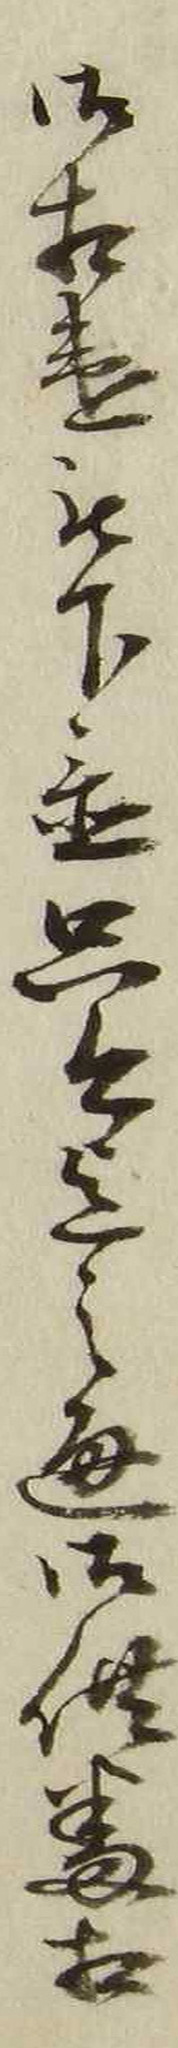御相違被下置只今迄之通御供番相
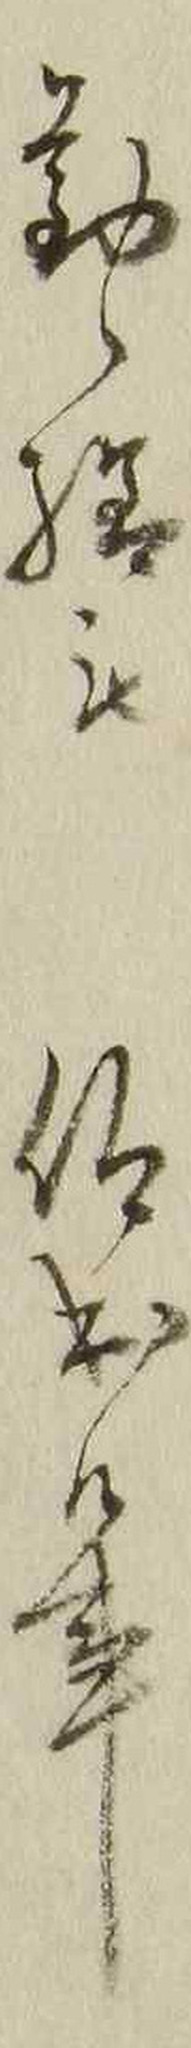勤候様被仰出候事
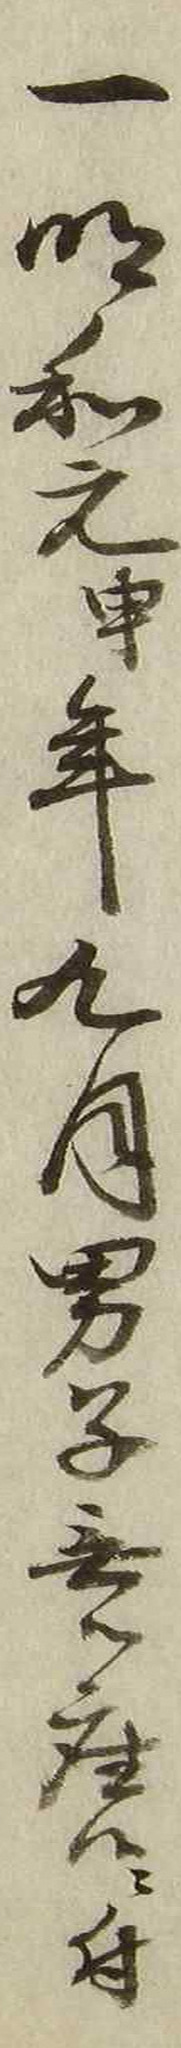一明和元申年九月男子無御座候ニ付
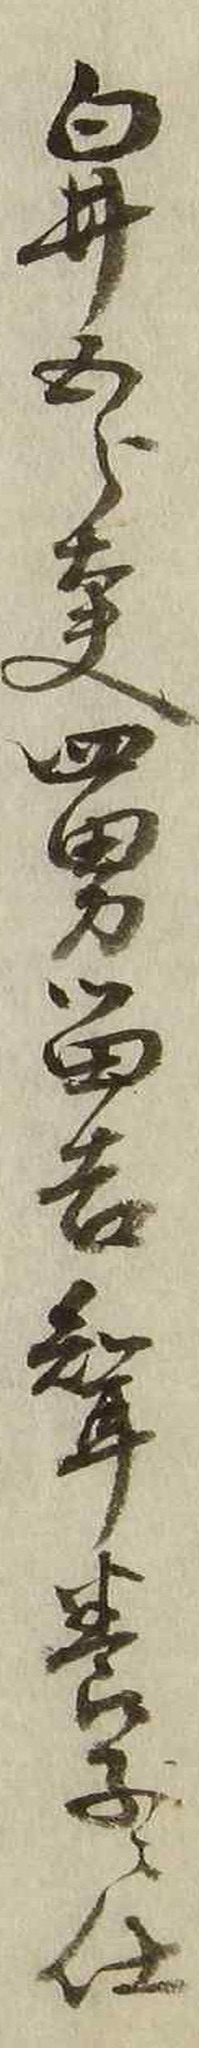白井五郎太夫四男留吉聟養子ニ仕
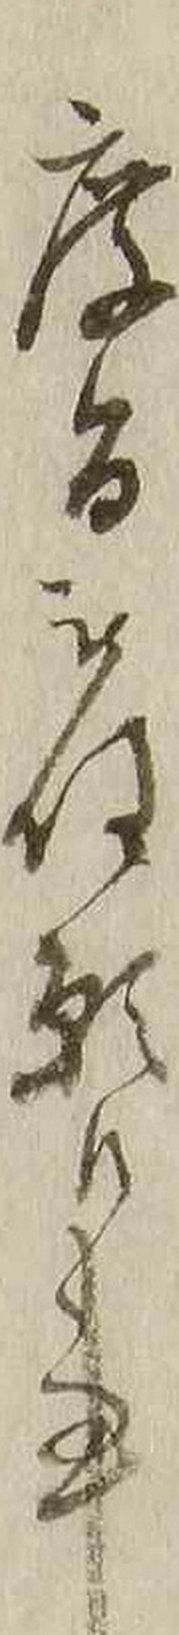度旨被任願候事
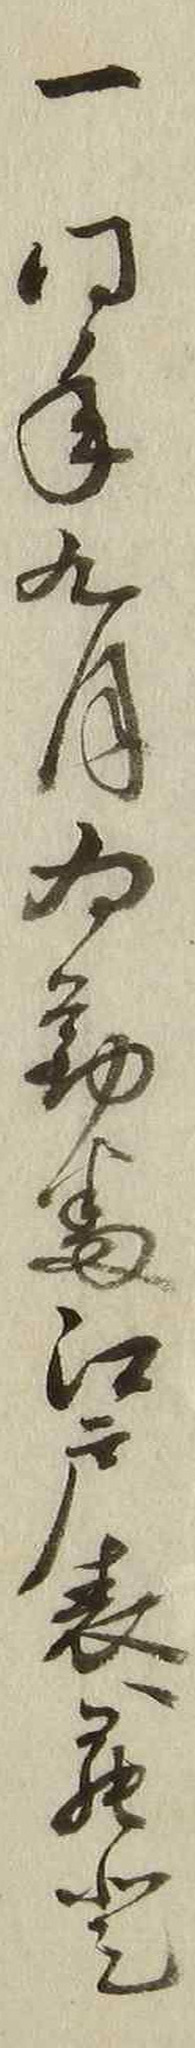一同年九月為勤番江戸表へ罷登
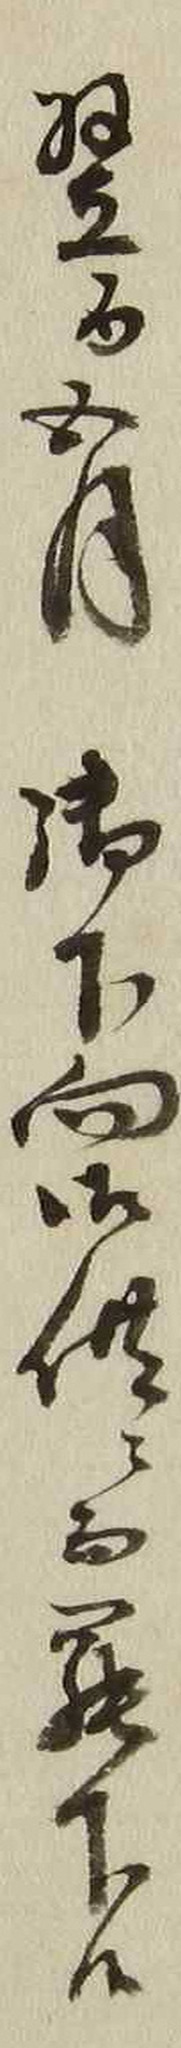翌酉五月御下向御供ニ而罷下候
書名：諸士系譜　巻之27　い之部27
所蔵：会津若松市立会津図書館
